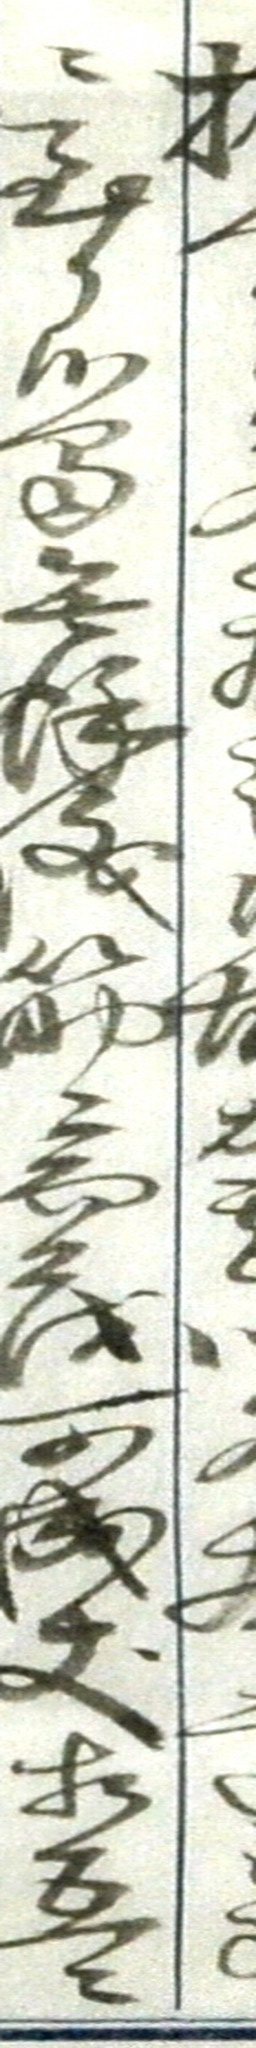に至り候間無余儀筋ニ而茂可成丈相互ニ
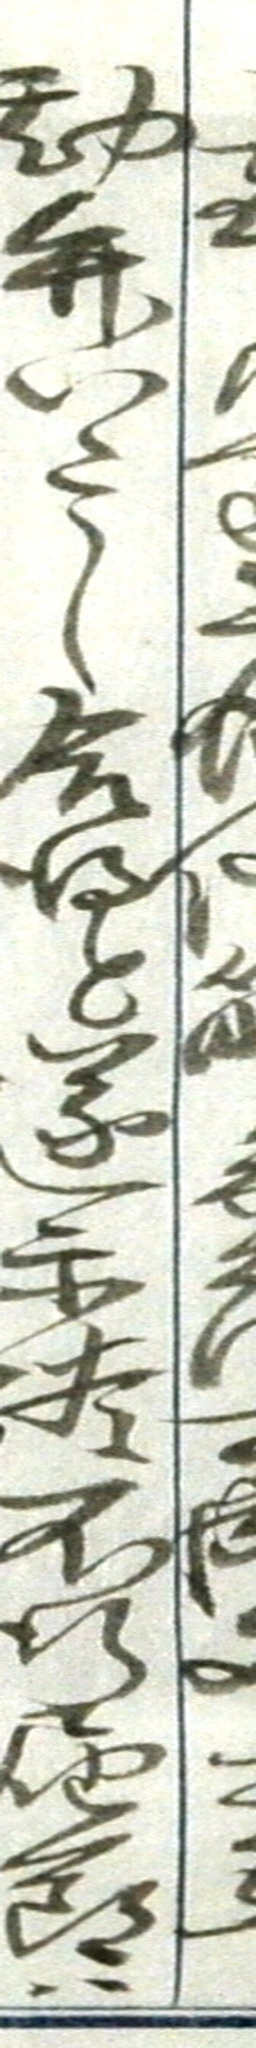勘弁いたし合得と遂示談不行届節ハ
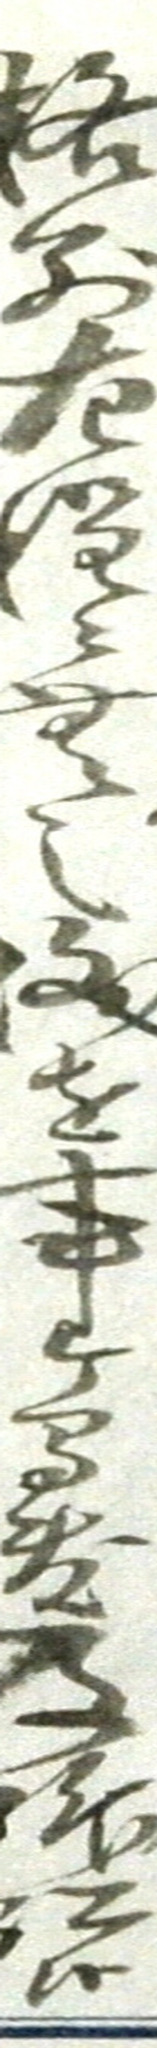格別左程に無之儀を事ケ間敷及訴訟候
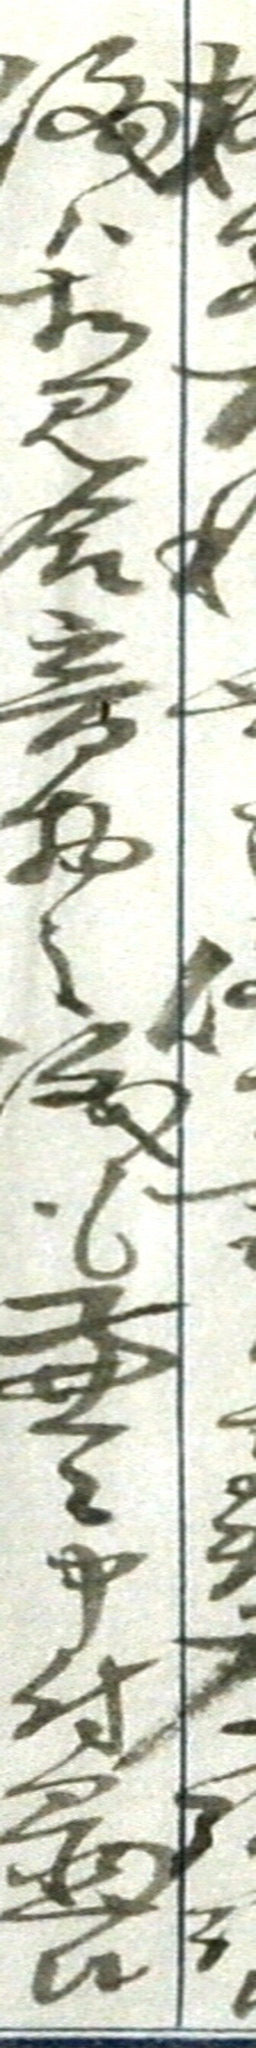儀ハ相見合音物之儀も兼々申付置候
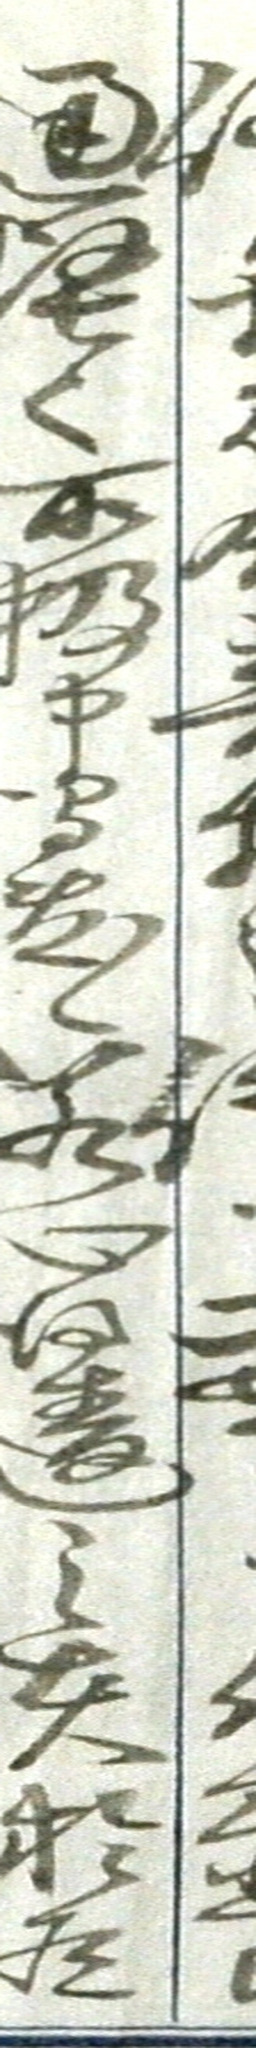通堅く取扱申間敷候若心得違之者於有
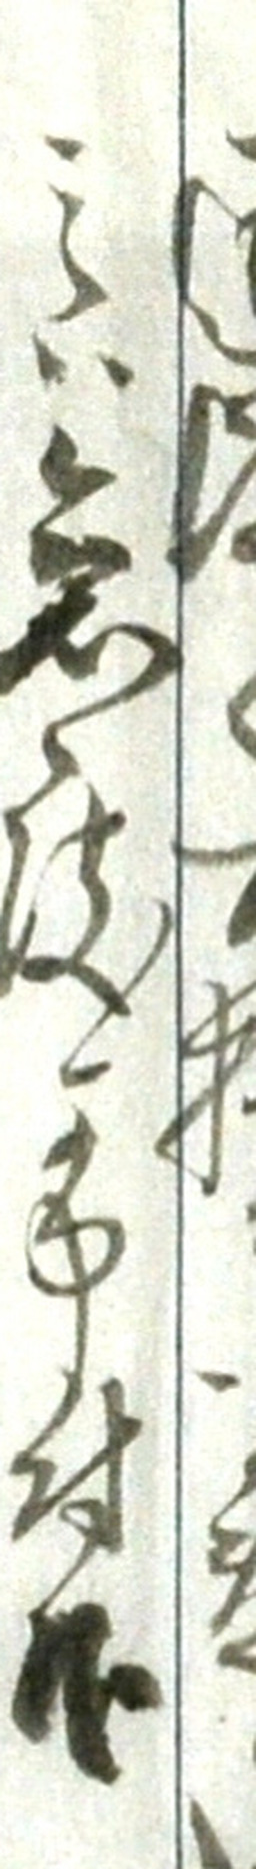之ハ急度可申付候
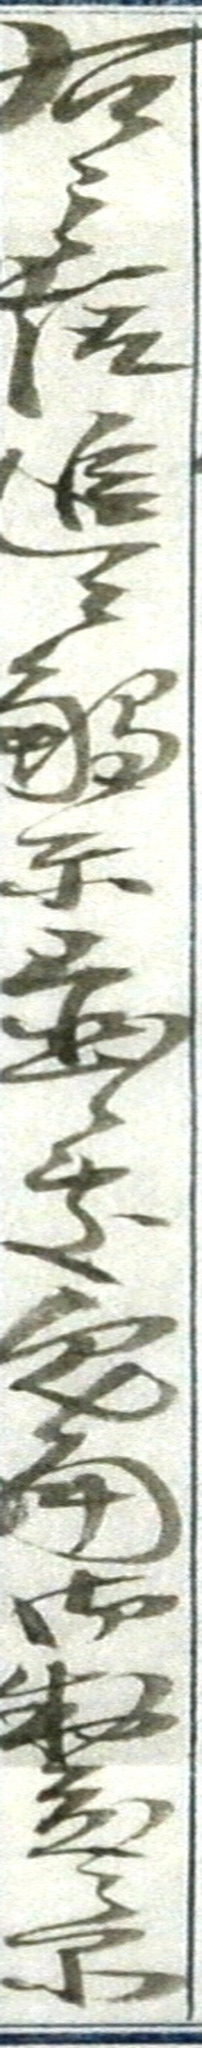右の趣追々触示置候処兎角御制度ニ品
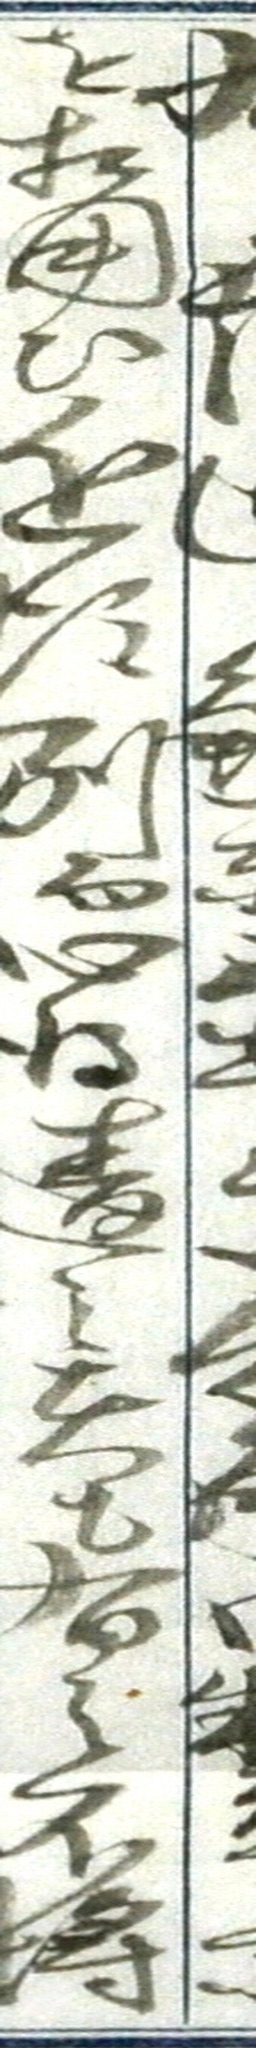を相用ひ近頃別而心得違之者も有之不埒
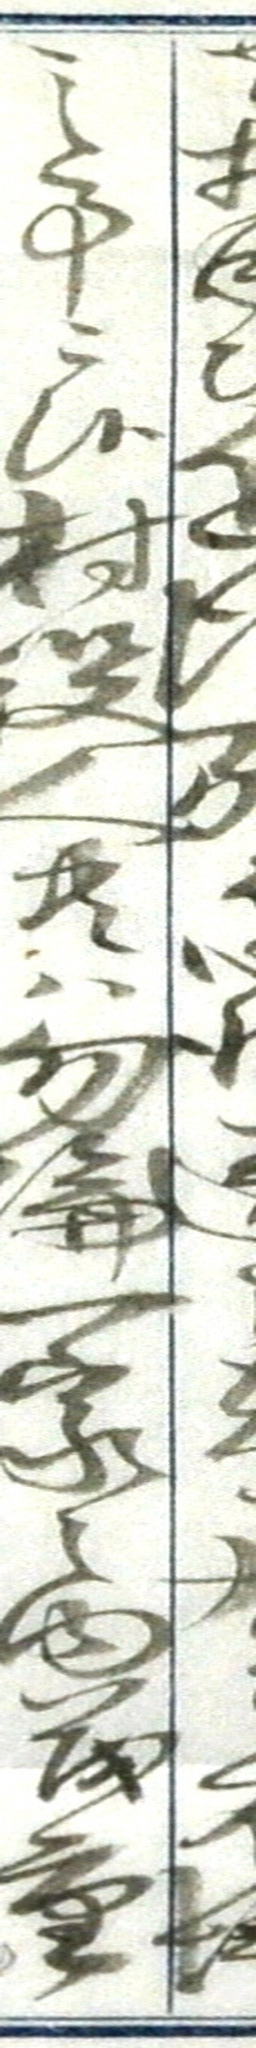之事ニ候村役人共ハ勿論一家之内茂重
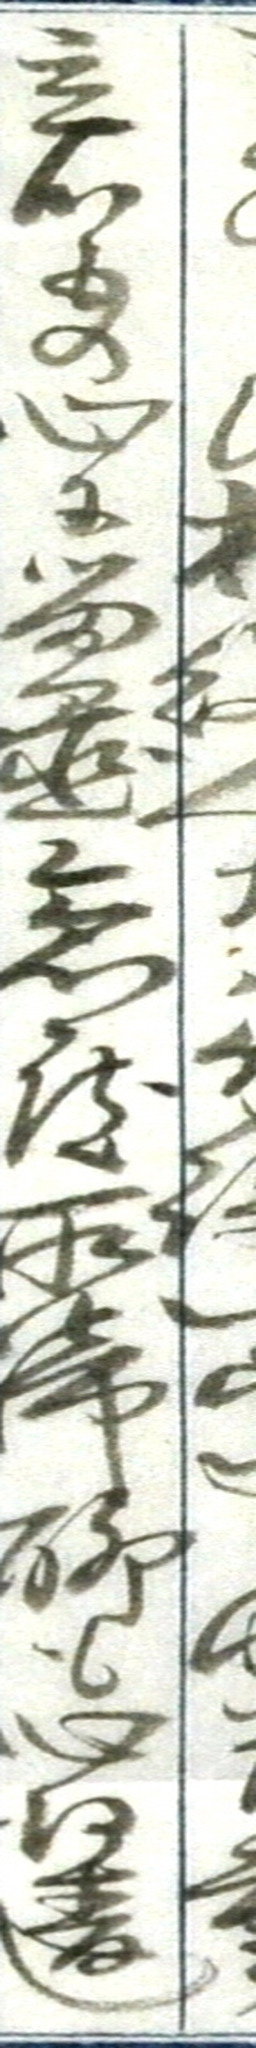立候もの心に留置急度取締聊も心得違
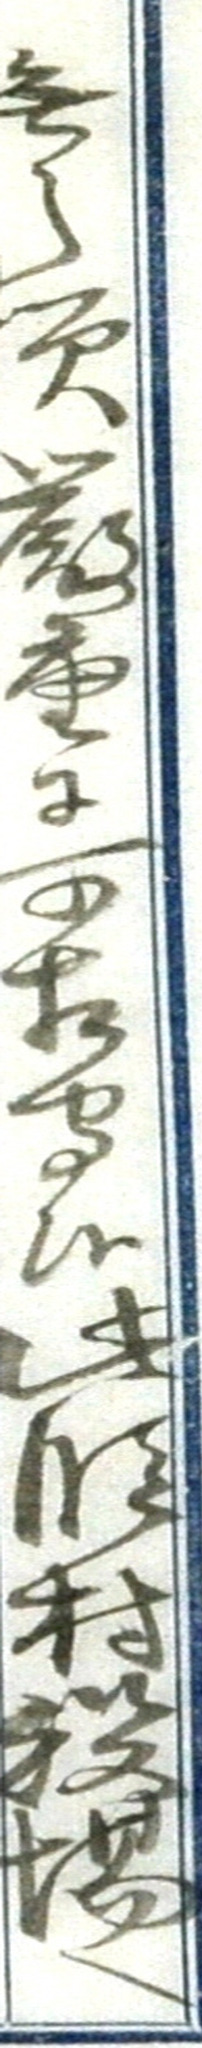無之様厳重に可相守候此段村役場ヘ
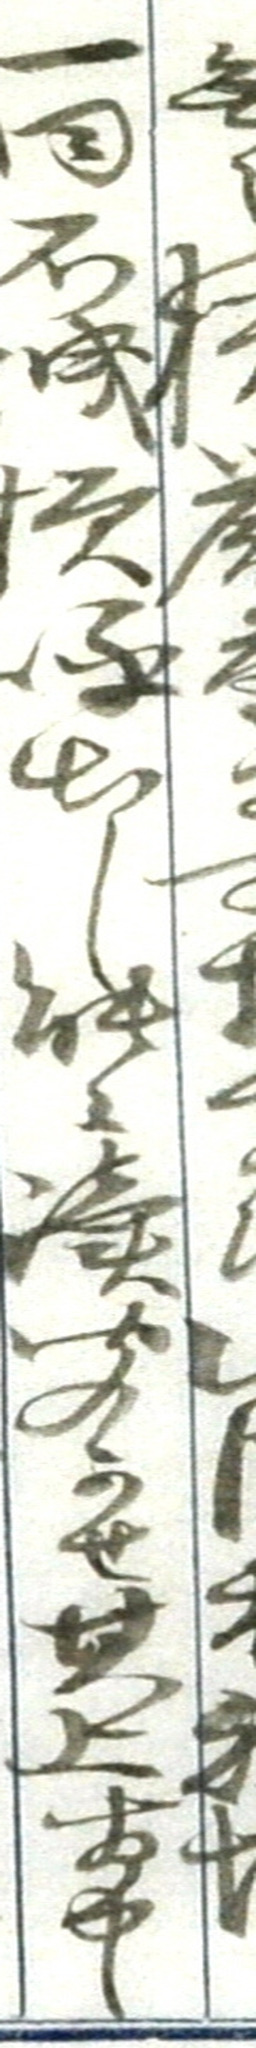一同不洩様呼出し能々読聞かせ其上為申
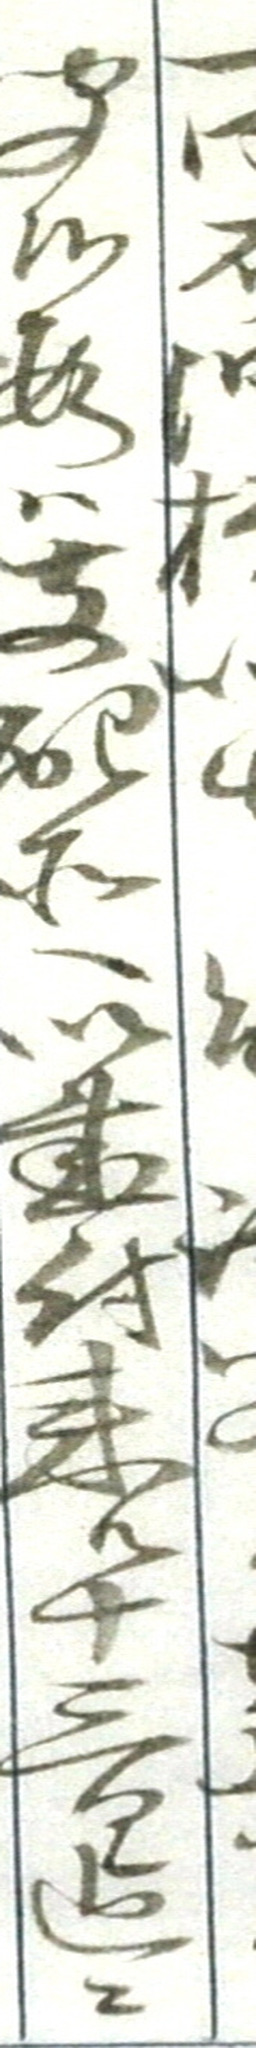聞候段は支配所ヘ以書付来ル十三日迄ニ
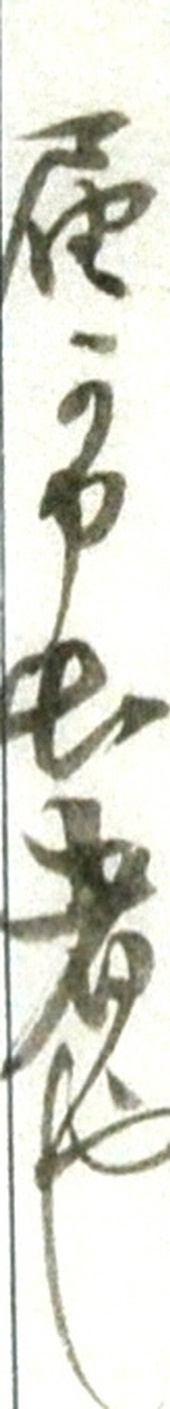届可申出者也
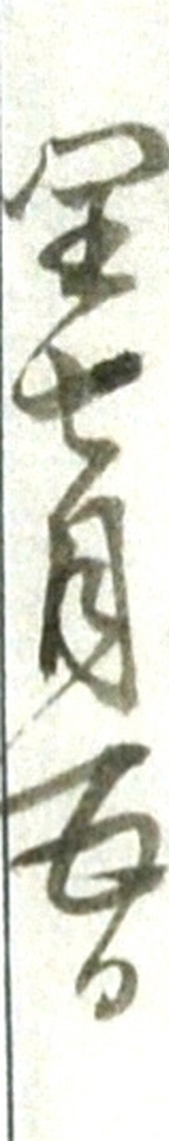閏七月五日

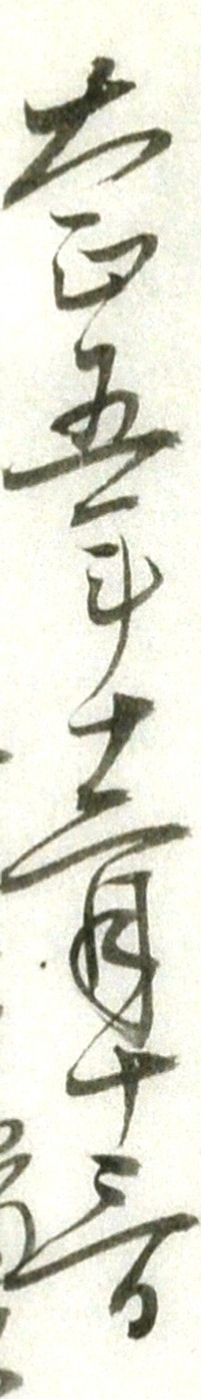大正五年十二月十三日
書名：御触書
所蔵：伊那市立高遠町図書館・合同会社AMANE
